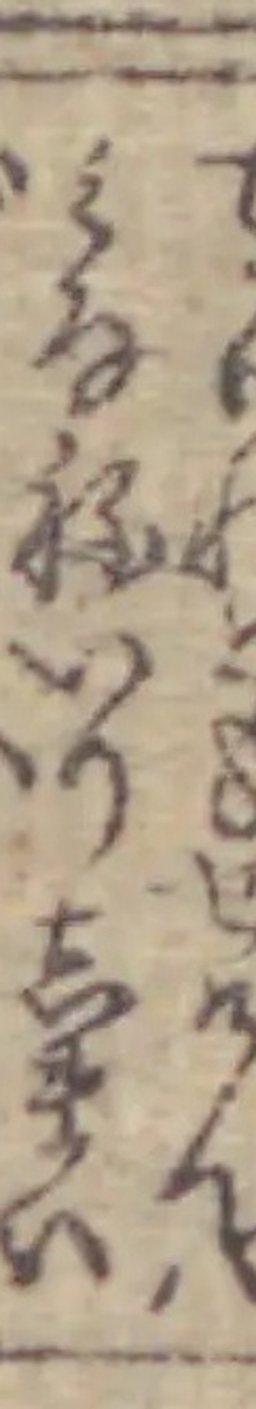みなねいりしまい
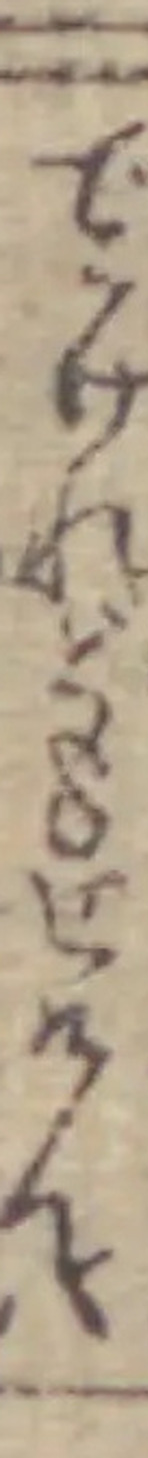でかけれどもせけんは
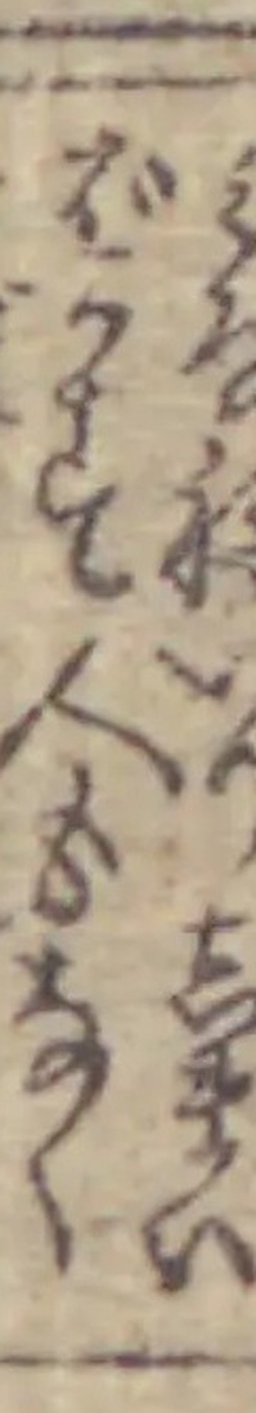ばかす人もなく
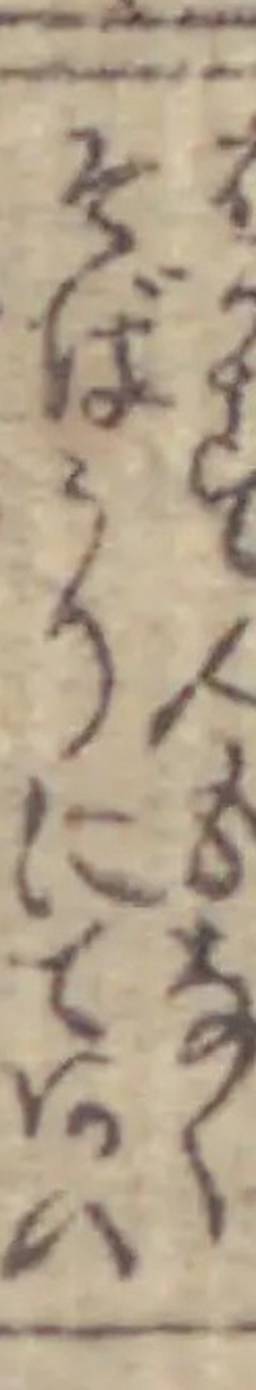そばうりにてあい
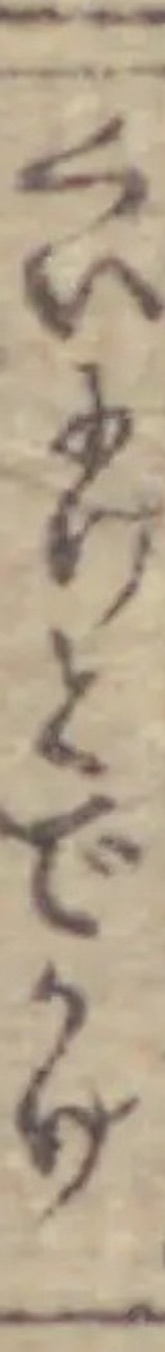くいにけとでかけ
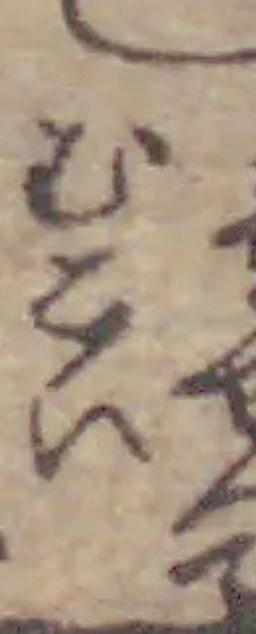むこい
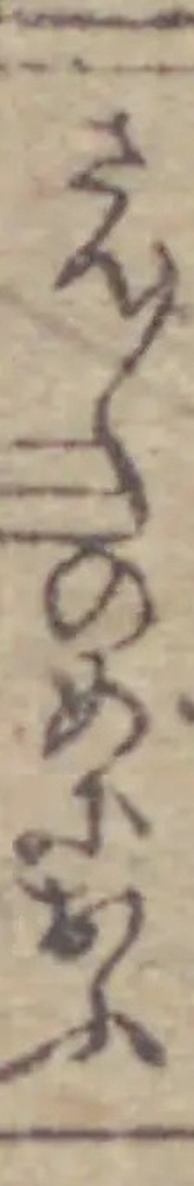さん〳〵のめにおふ
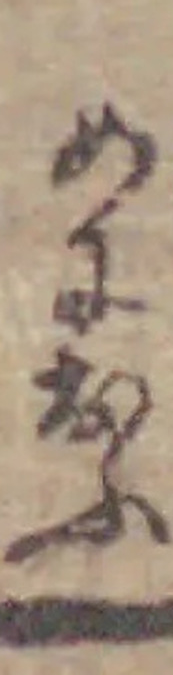めにおふ
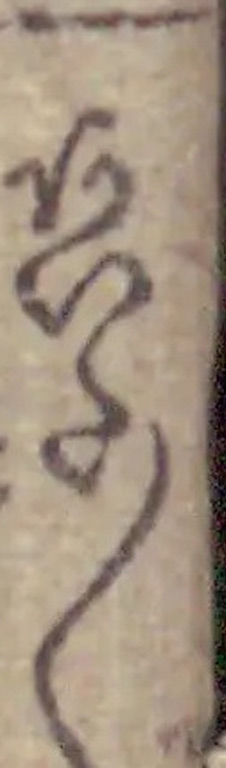あいた〳〵
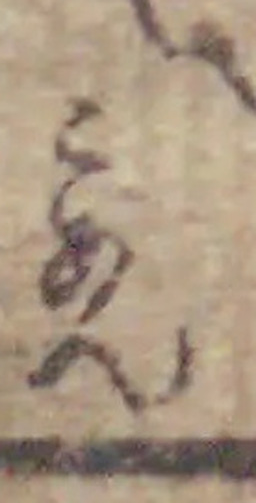こめん
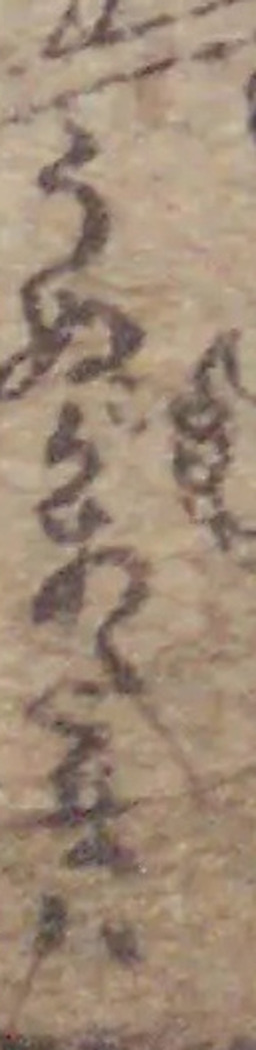うぬがあたまは
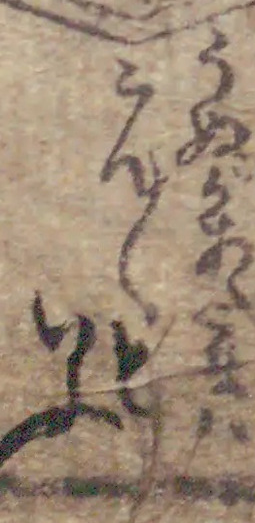こん〳〵と

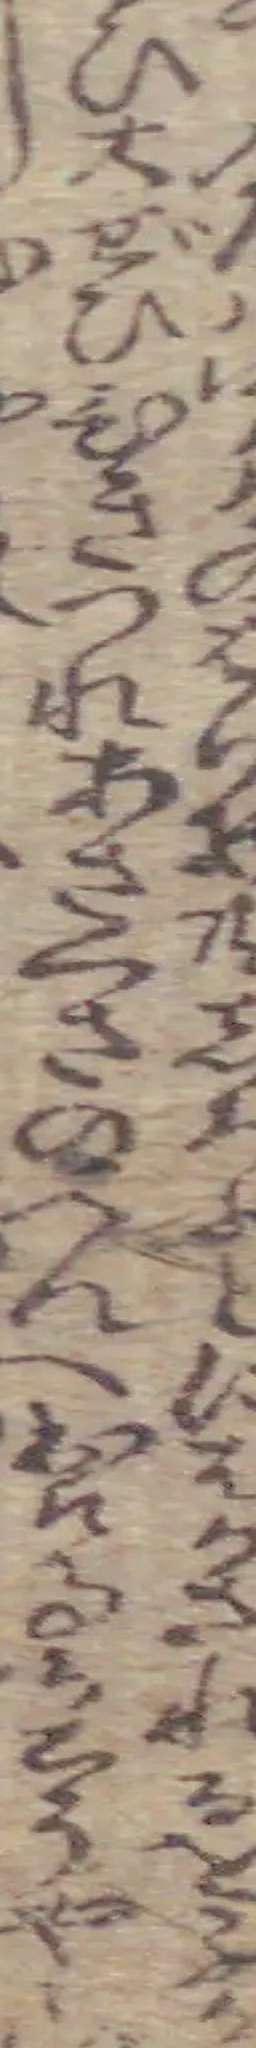おもひ大ぜひひきつれあさくさのへんへ出けるかこうや山の
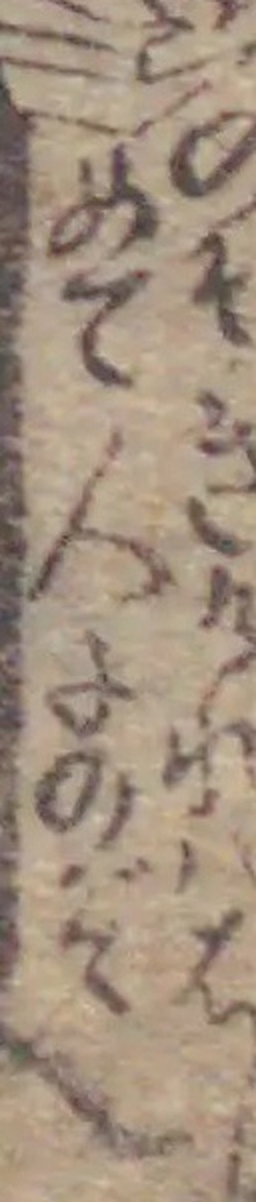めて人にのぞ
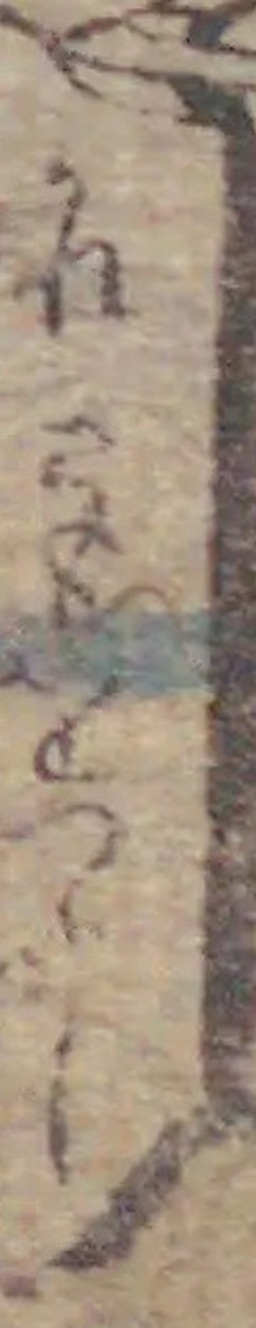かれきもをつふし
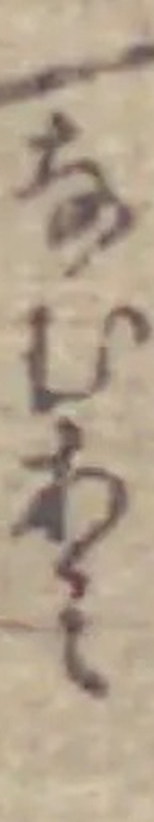なむあみ
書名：化物箱根先 2巻
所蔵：国立国会図書館 National Diet Library, JAPAN
